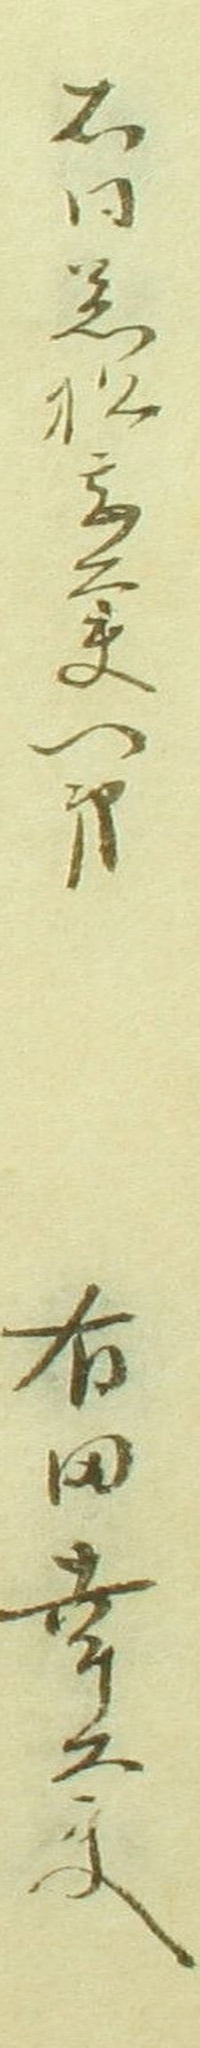右同若松甚太夫門弟有田幸太夫
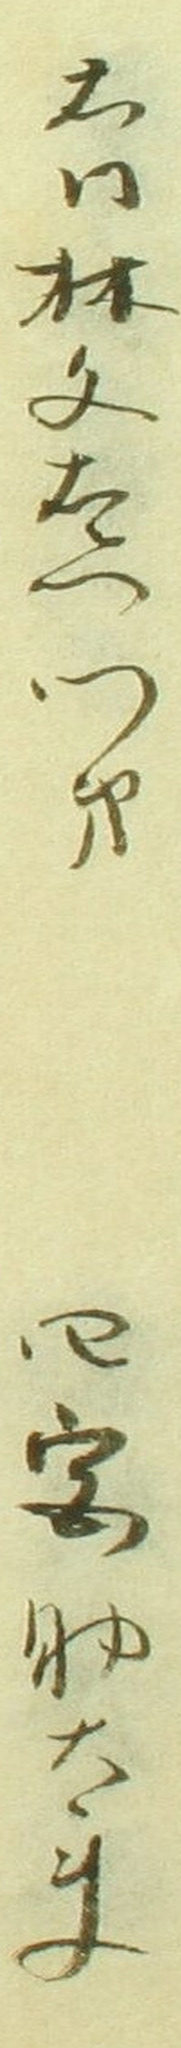右同林文右衛門門弟四宮助太夫
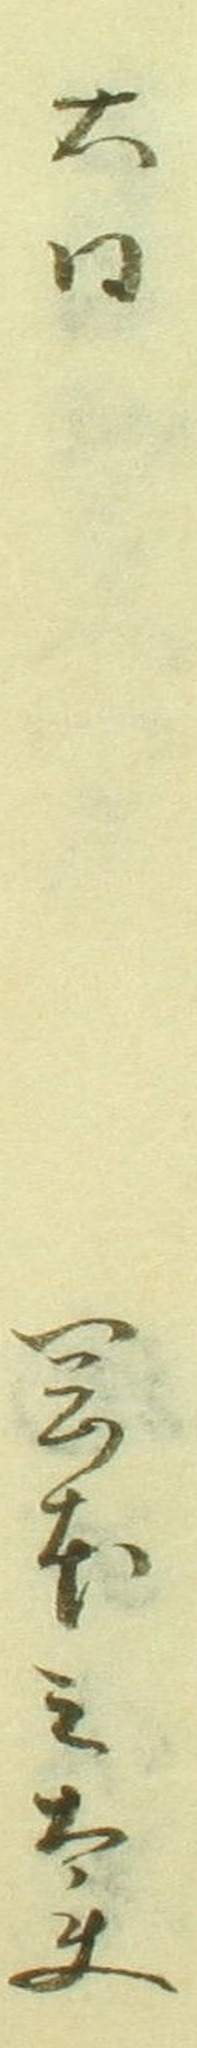右同岡本三太夫
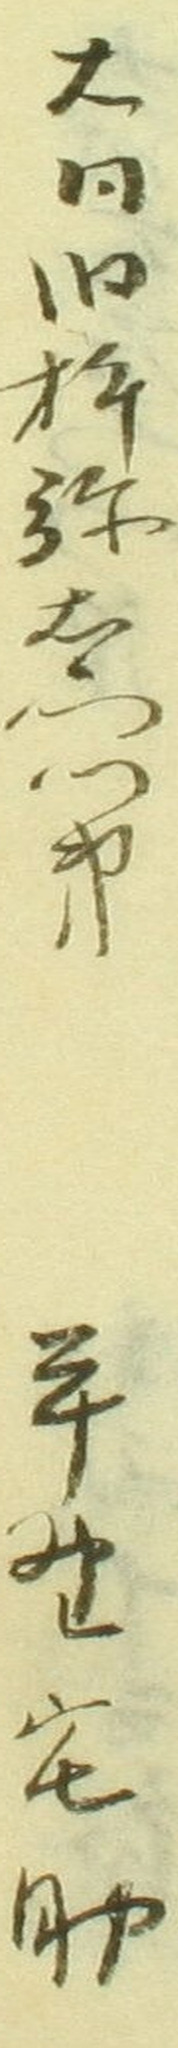右同臼杵弥右衛門門弟平野宅助
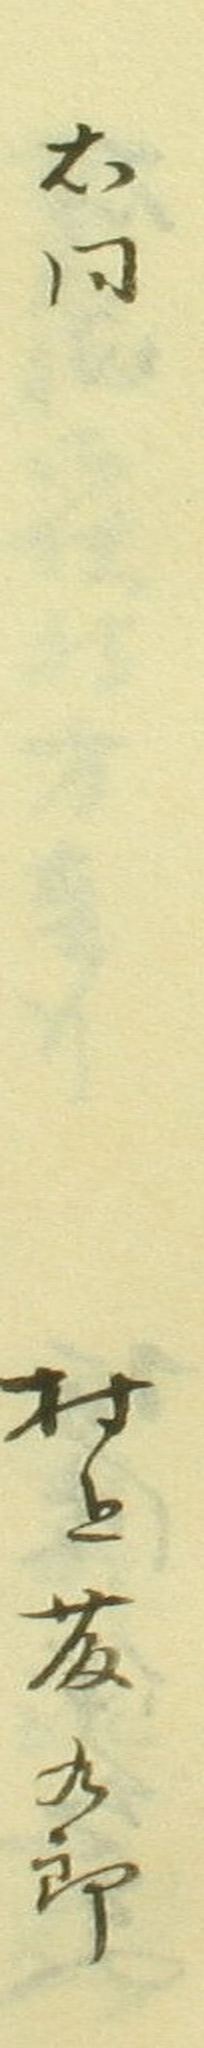右同村上藤九郎
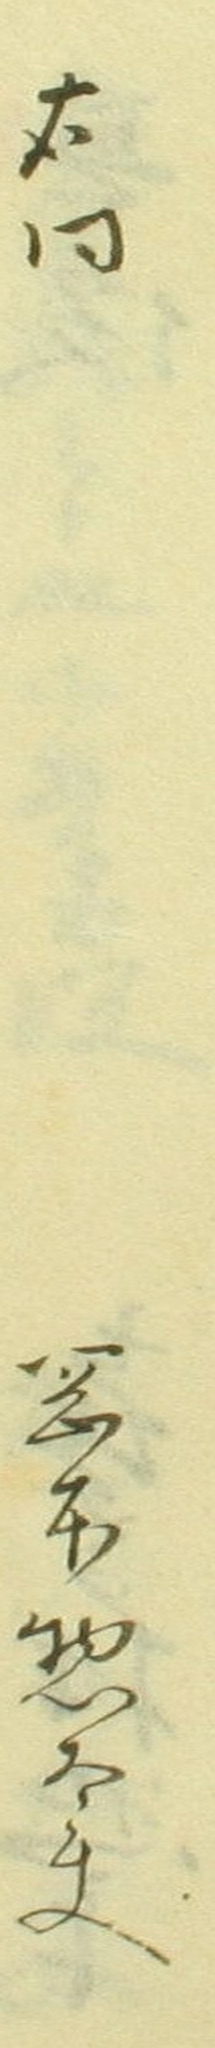右同岡本惣太夫
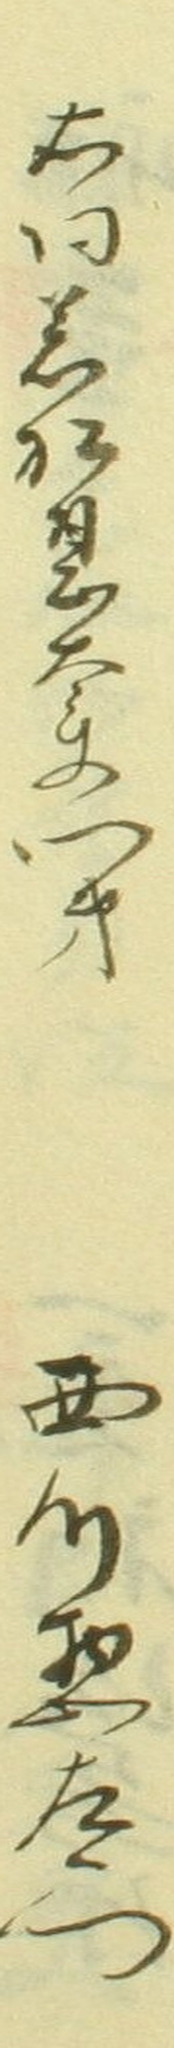右同若松甚太夫門弟西川惣左衛門
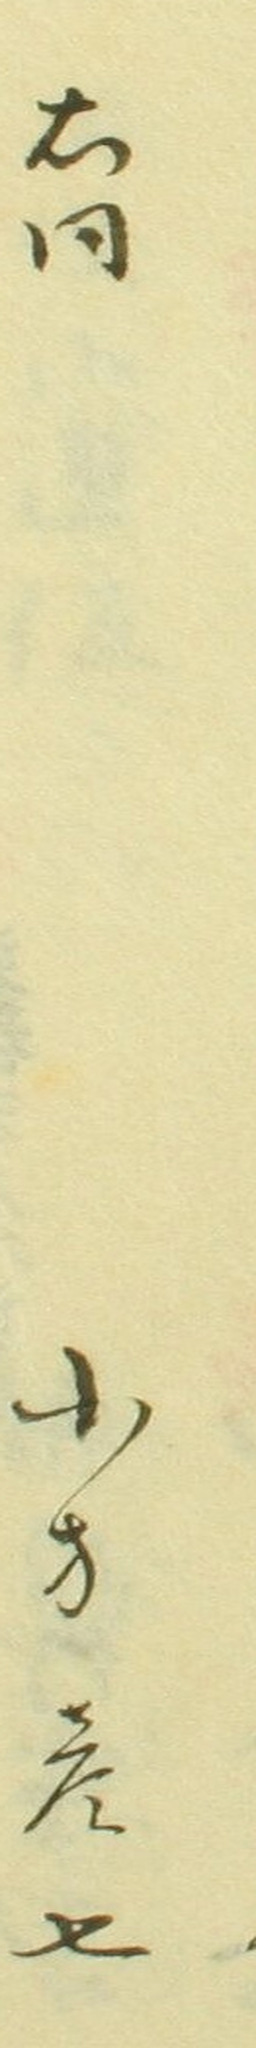右同小方彦七
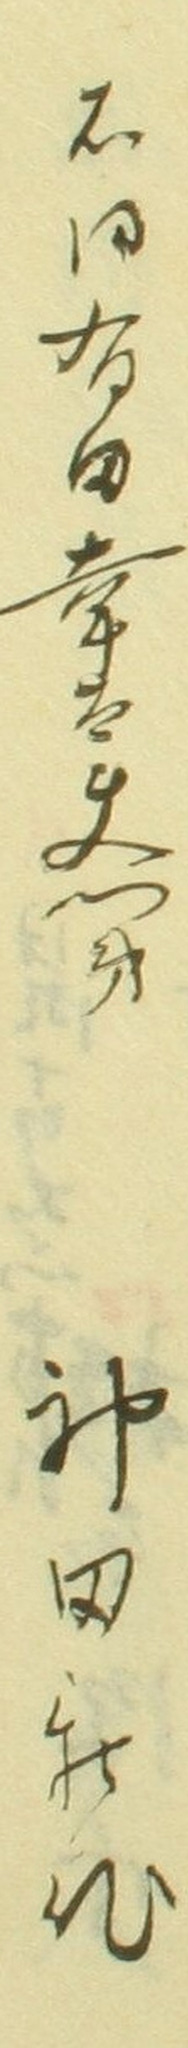右同有田幸太夫門弟神田新作
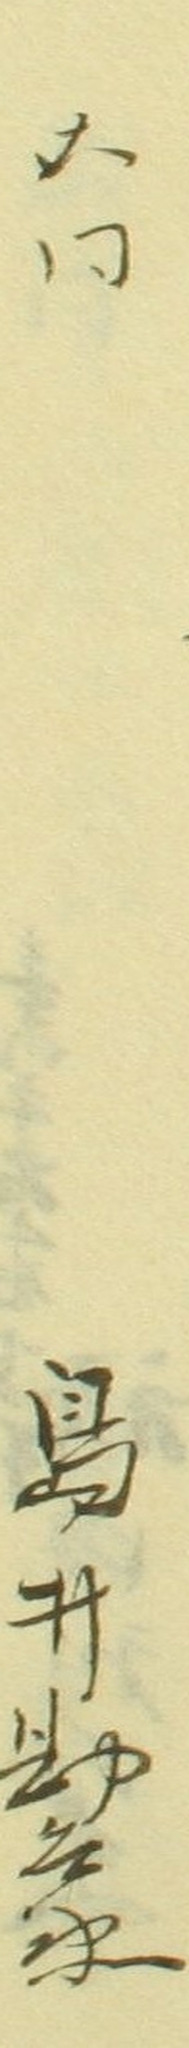右同島井勘兵衛
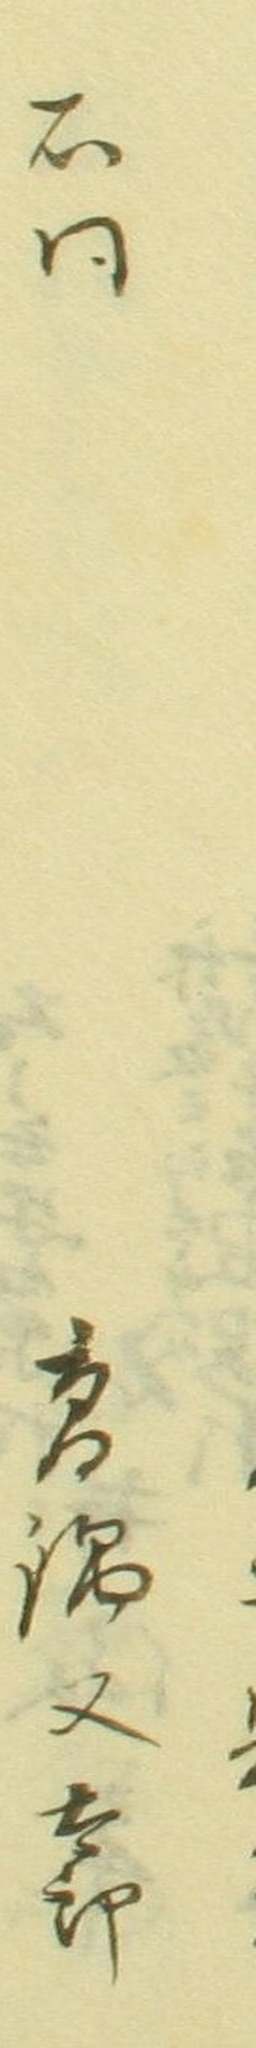右同高鍋又太郎
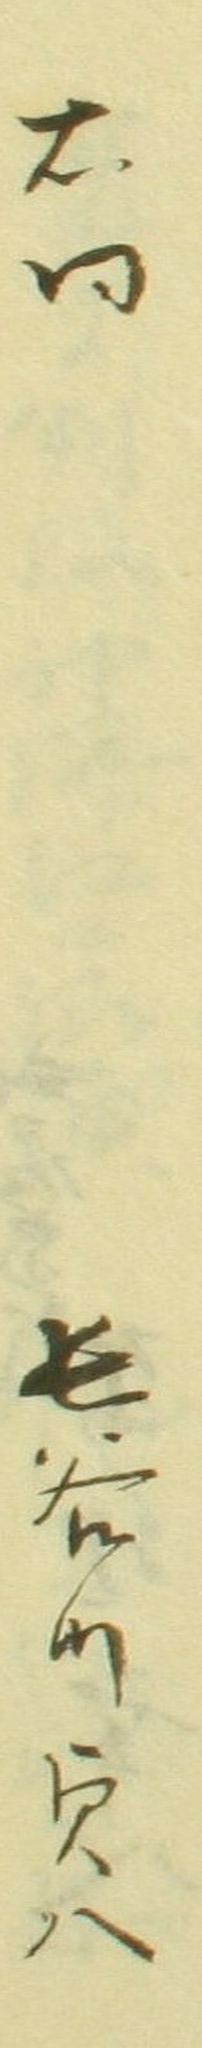右同長谷川貞八
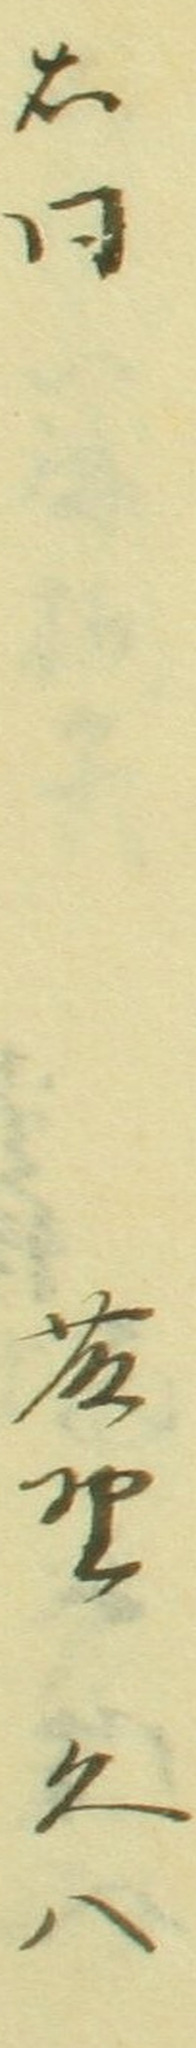右同藤野久八

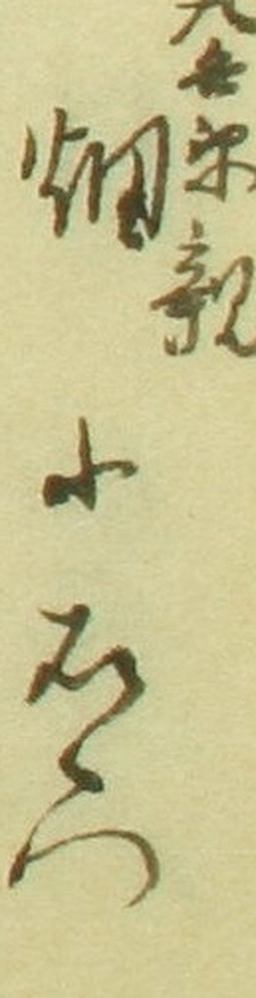畑小右衛門
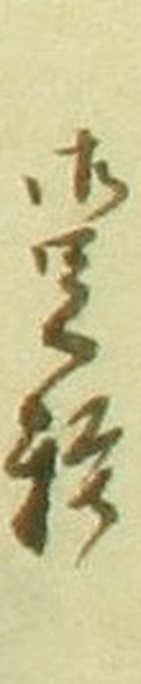御足軽
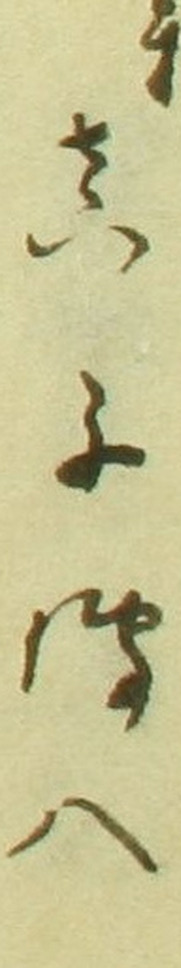真子伝八
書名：唐船漂流記 二
